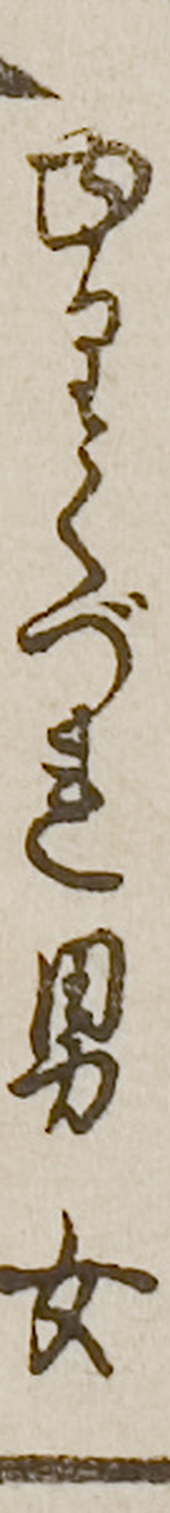ゆりくづれ男女
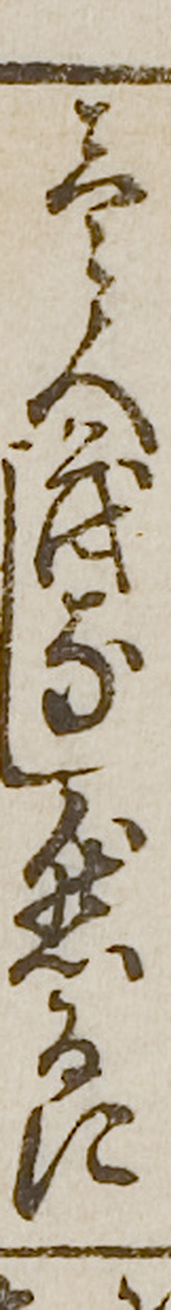壱人もなし然るに
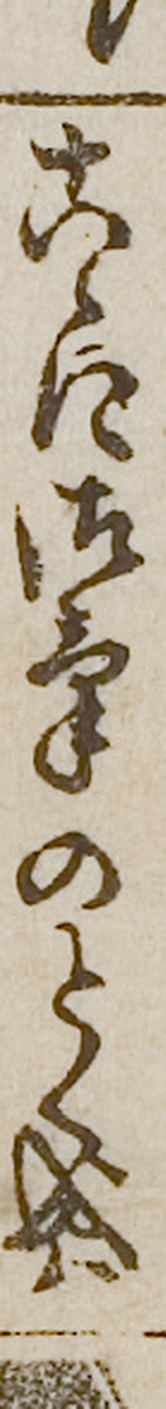こゝに御気のとく成は
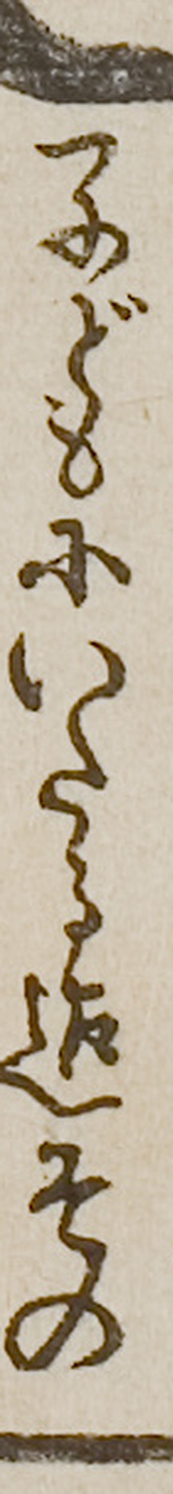子どもにいたる迄その
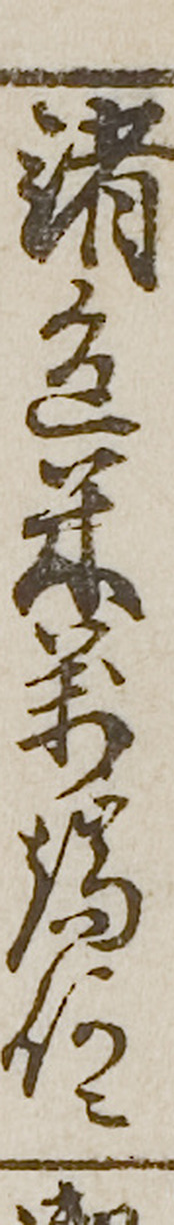諸色米万端何に
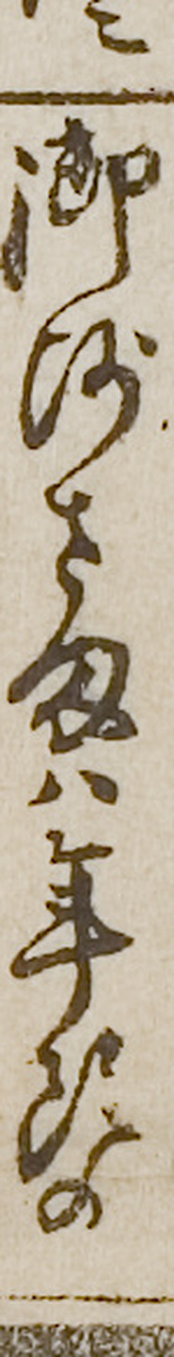御師さまは年頭の
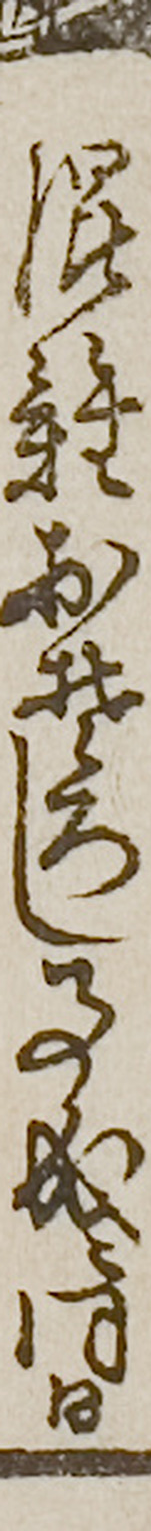混雑おそろし事成に同日
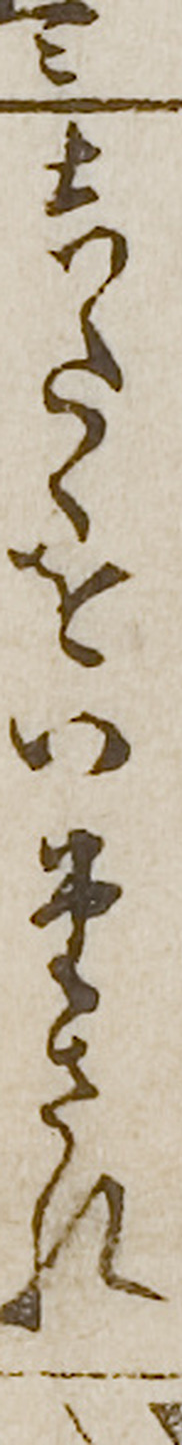したくをいたされ
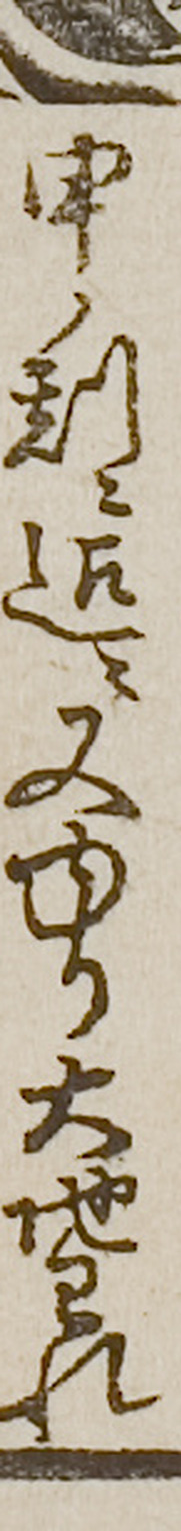申ノ刻と迄に又ゆり大地われ
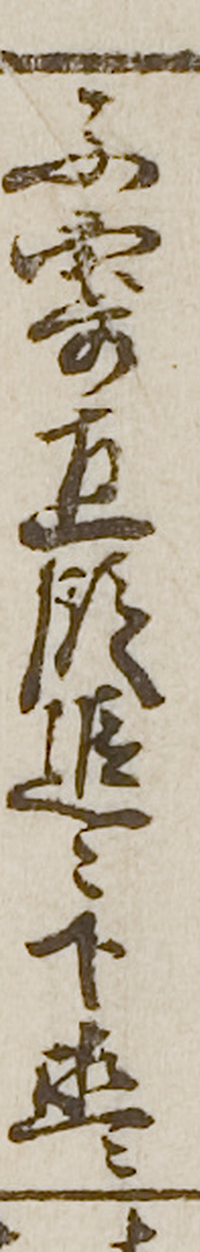不寄直段追々下直に
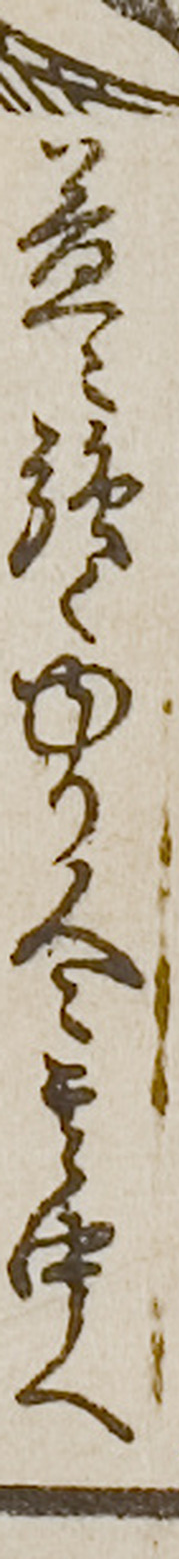益々強くゆり人々其中へ
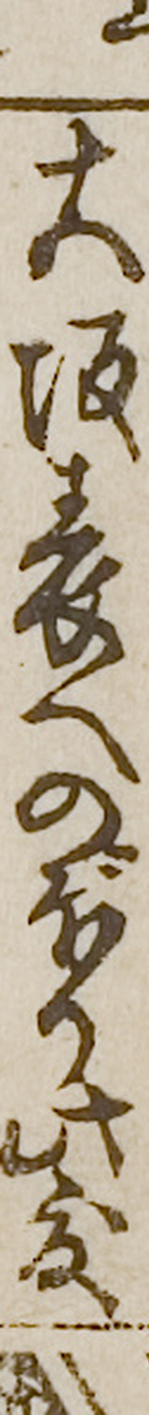大坂表へのぼり此度
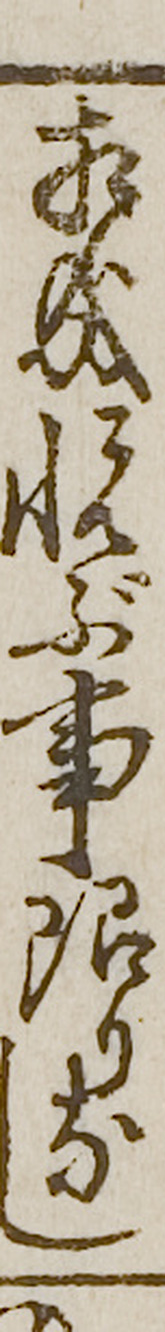相成悦ぶ事限りなし
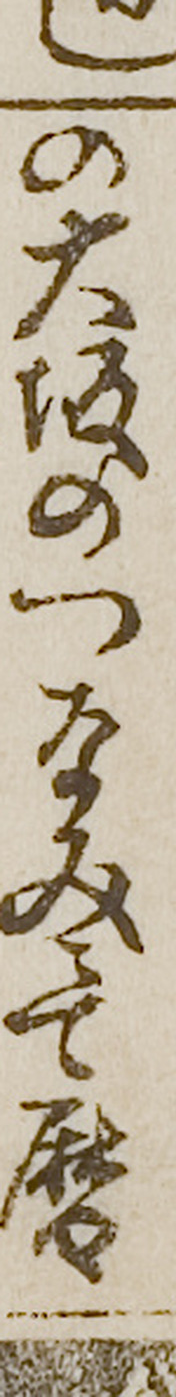の大坂のつなみにて暦
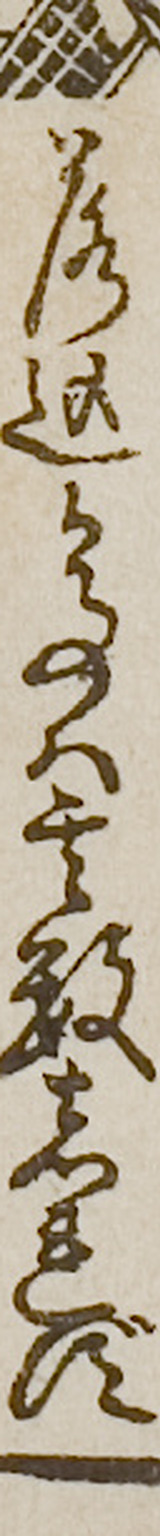落込候事は其数しれず
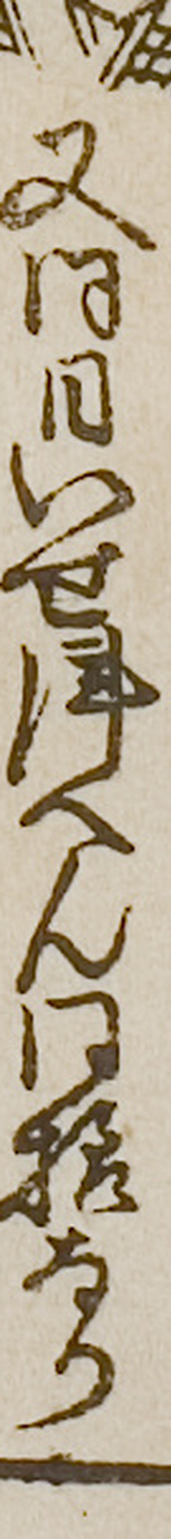又同日いせ津へん同様なり
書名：諸国大地震大津波 三編
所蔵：東京大学総合図書館 General Library in the University of Tokyo, JAPAN
